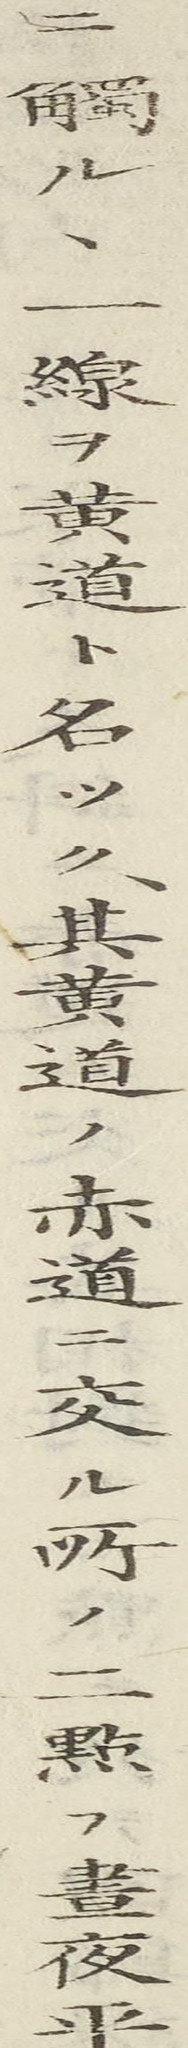ニ触ルヽ一線ヲ黄道ト名ツク、其黄道ノ赤道ニ交ル所ノ二点ヲ昼夜平
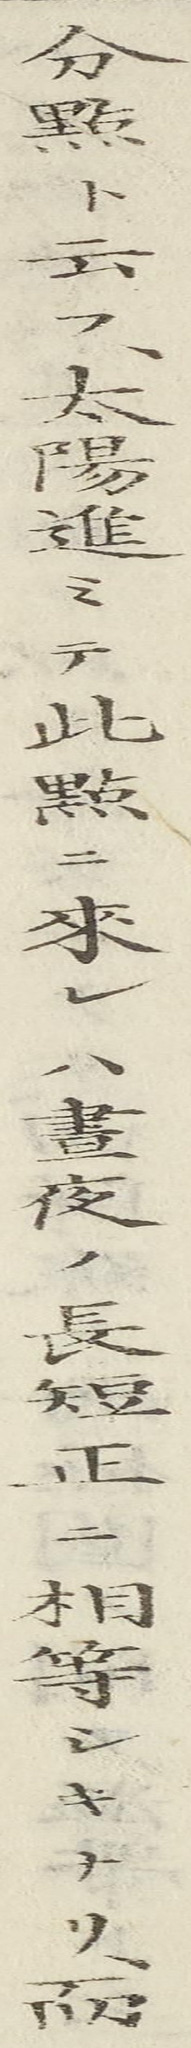分点ト云フ、太陽進ミテ此点ニ来レハ昼夜ノ長短正ニ相等シキナリ、而
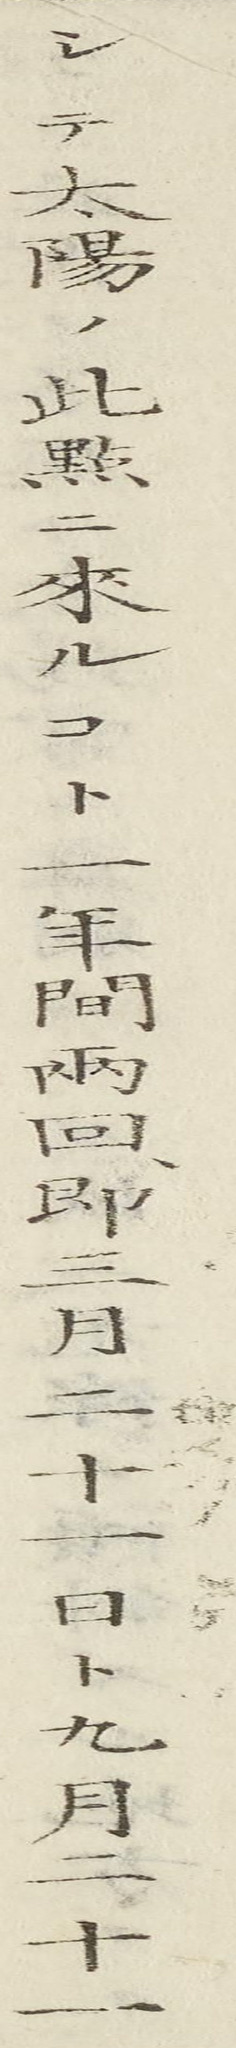シテ太陽ノ此点ニ来ルコト一年間両回、即三月二十一日ト九月二十一
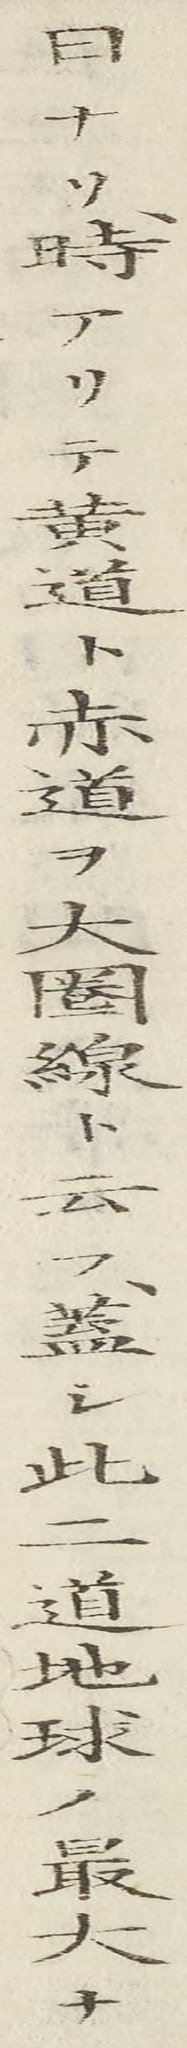日ナリ、時アリテ黄道ト赤道ヲ大圏線ト云フ、蓋シ此ニ道地球ノ最大ナ
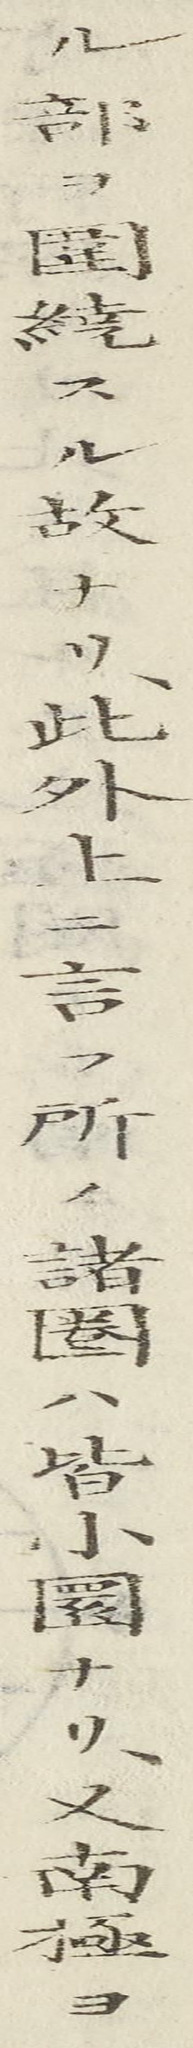ル部ヲ囲繞スル故ナリ、此外上ニ言フ所ノ諸圏ハ皆小園ナリ、又南極ヨ
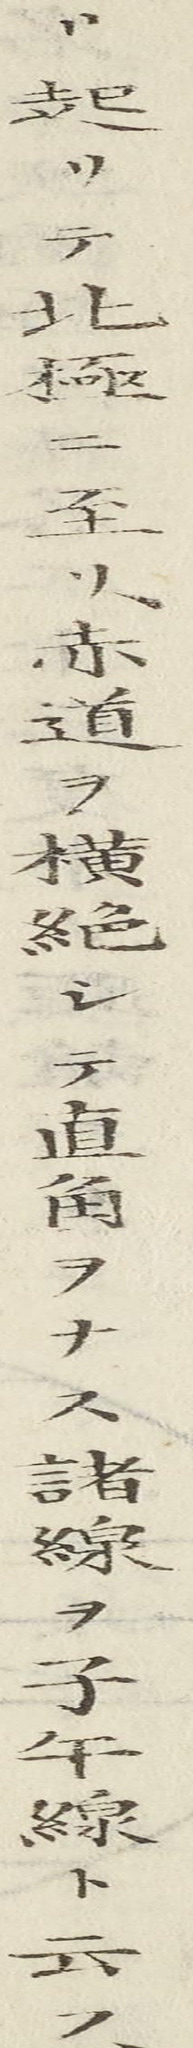リ起リテ北極ニ至リ、赤道ヲ横絶シテ直角ヲナス諸線ヲ子午線ト云フ、
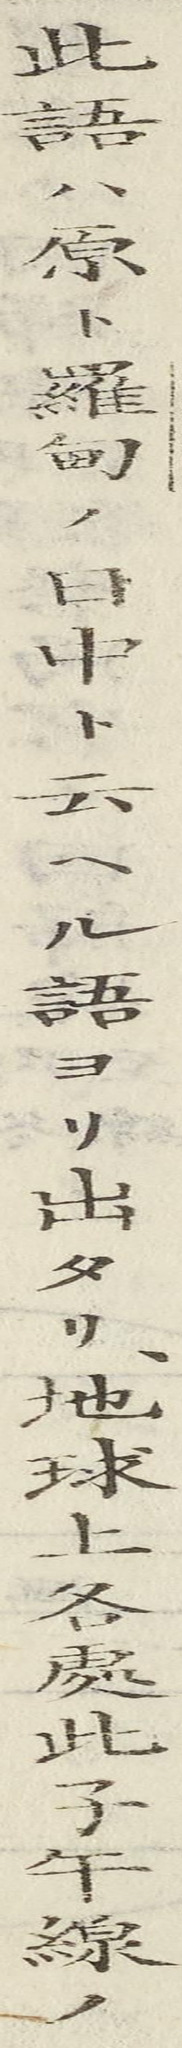此語ハ原ト羅旬ノ日中ト云ヘル語ヨリ出タリ、地球上各処此子午線ノ
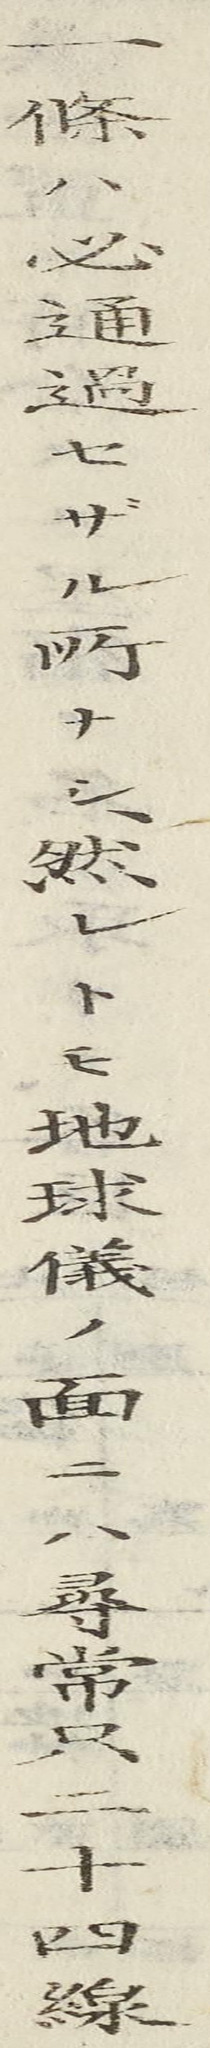一条ハ必通過セザル所ナシ、然レトモ地球儀ノ面ニハ尋常只二十四線
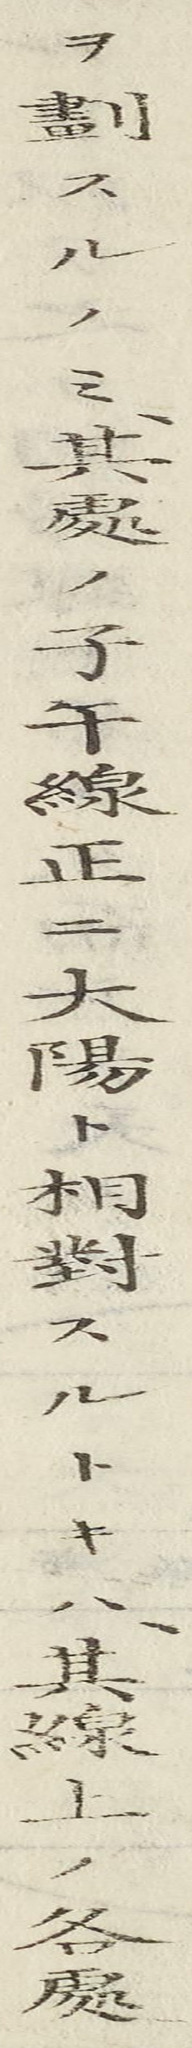ヲ割スルノミ、其処ノ子午線正ニ太陽ト相対スルトキハ、其線上ノ各処
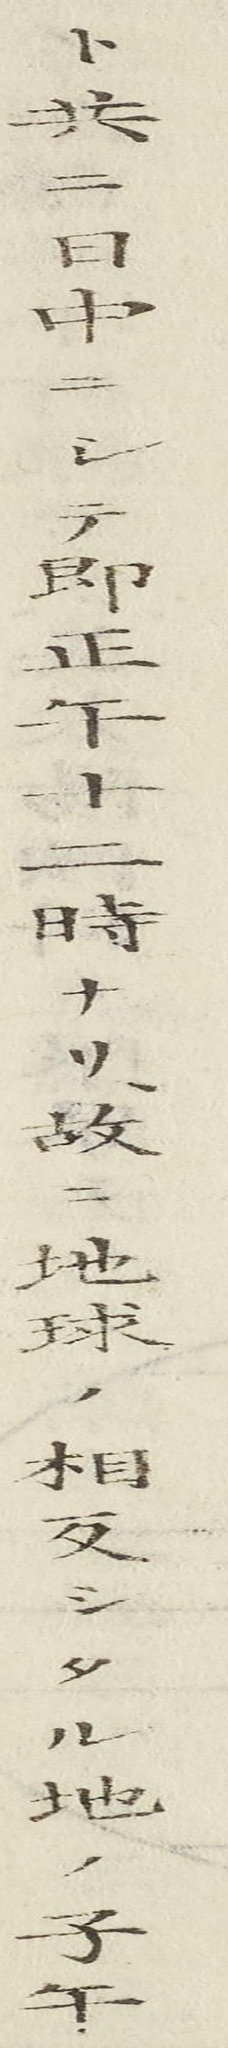ト共ニ日中ニシテ即正午十二時ナリ、故ニ地球ノ相反シタル地ノ子午
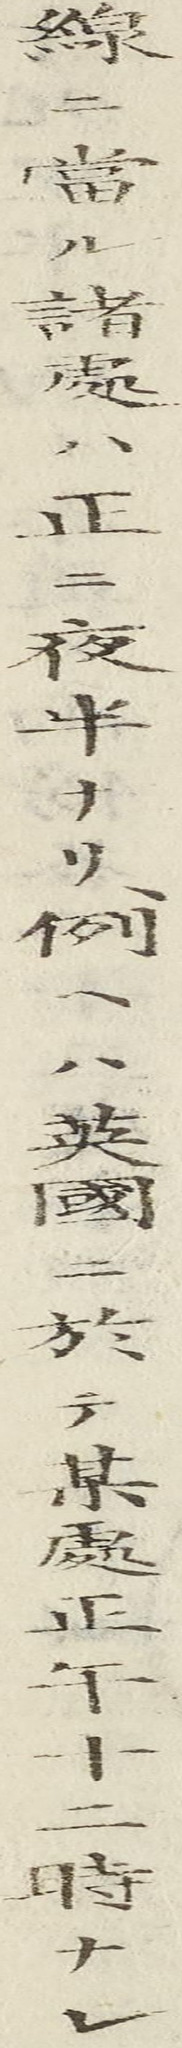線ニ当ル諸処ハ正ニ夜半ナリ、例ヘハ英国ニ於テ某処十二時ナレ
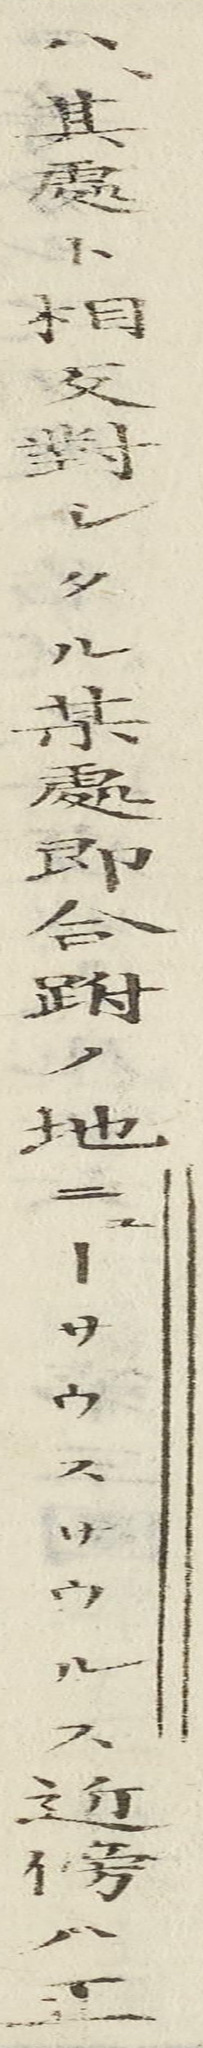ハ、其処ト相反対シタル某処即合跗ノ地ニューサウスサウルス近傍ハ正
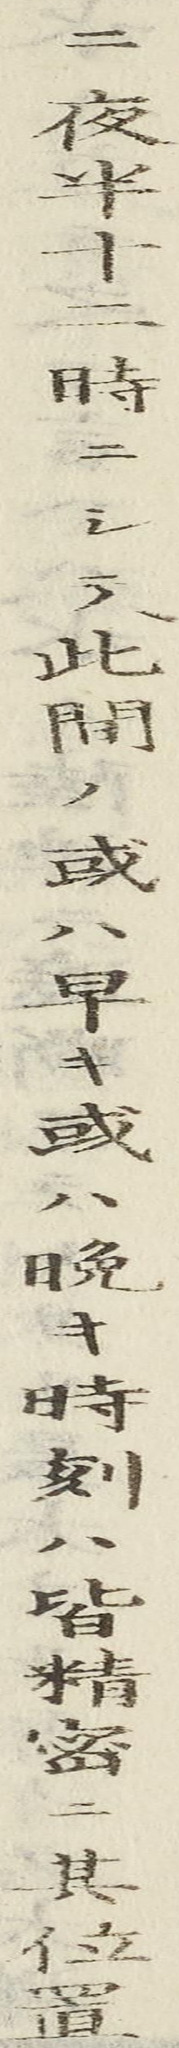ニ夜半十二時ニシテ、此間ノ或ハ早キ或ハ晩キ時刻ハ皆精密ニ其位置
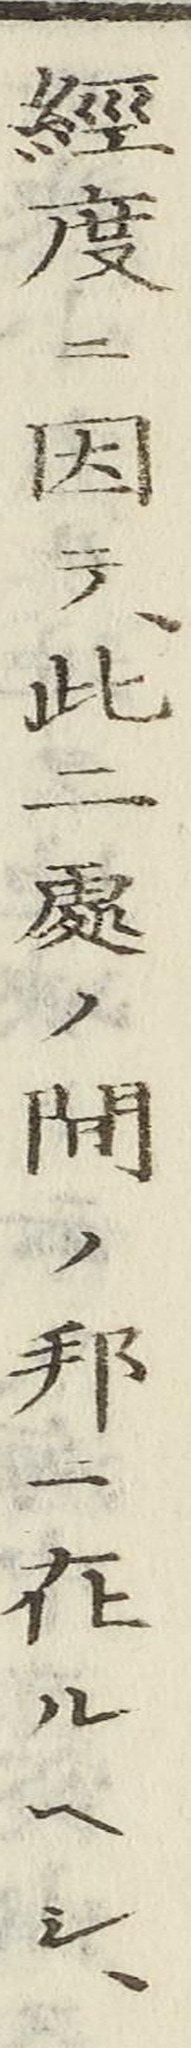経度ニ因テ、此ニ処ノ間ノ邦一在ルヘシ、
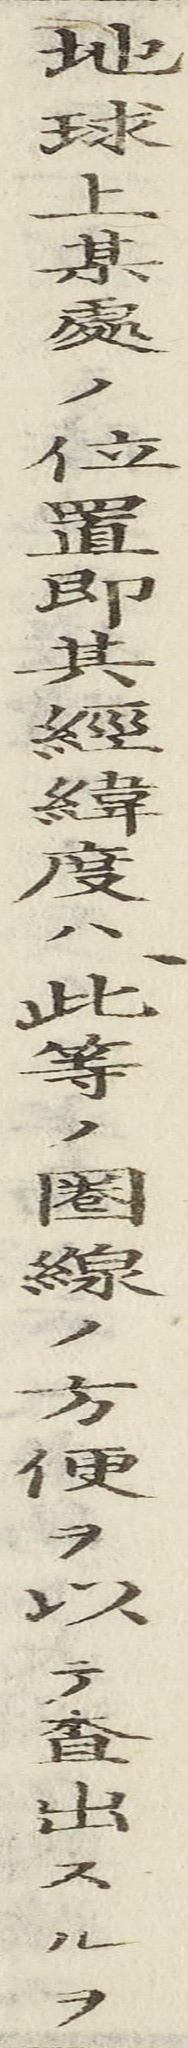地球上某処ノ位置即其経緯度ハ、此等ノ圏線ノ方便ヲ以テ査出スルヲ
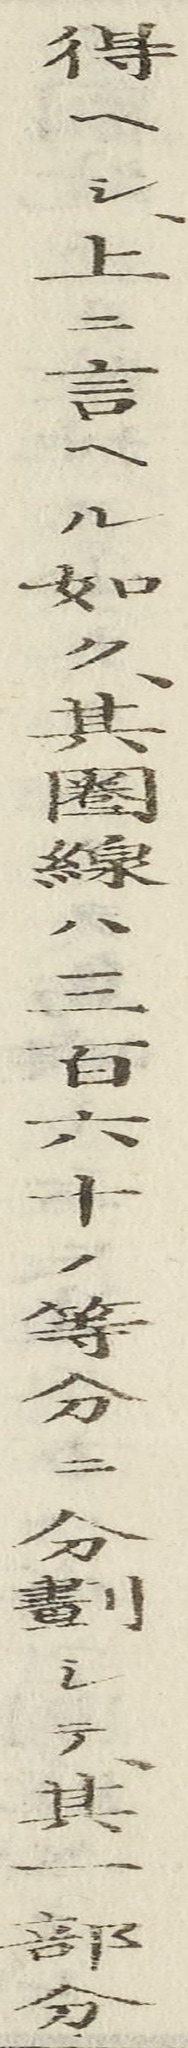得ヘシ、上ニ言ヘル如ク、其圏線ハ三百六十ノ等分ニ分割シテ、其一部分
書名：百科全書　地文學　全
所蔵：東京大学地震研究所図書室 Earthquake Research Institute Library, The University of Tokyo, JAPAN
